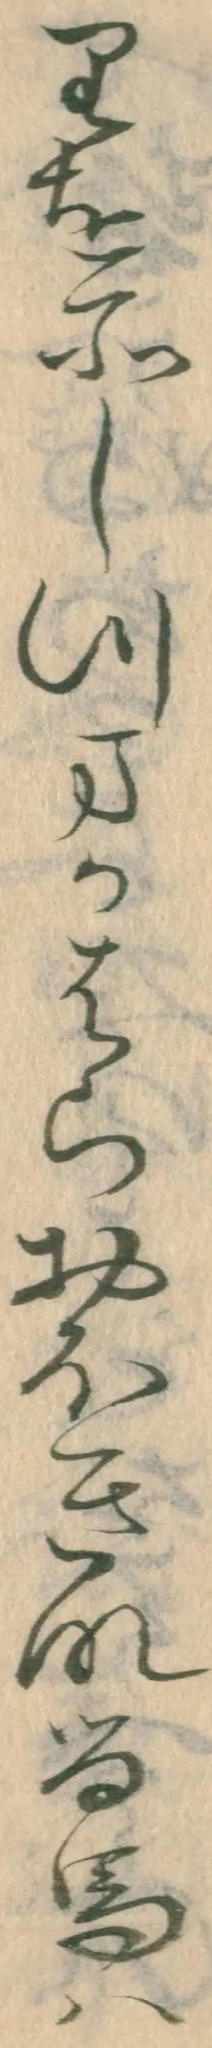りをそしつまかはらおほきなる馬は
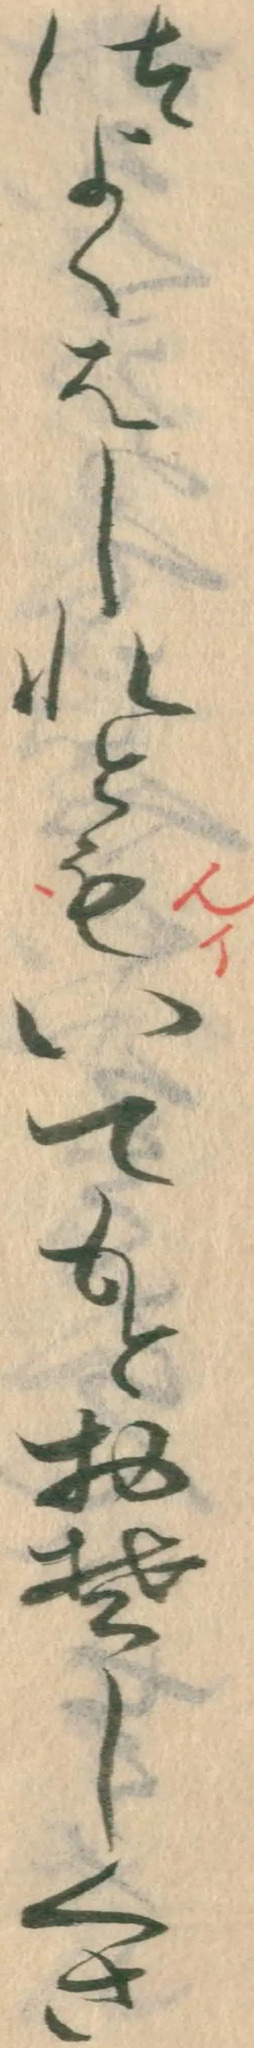つよくはしれともいてもとおそしくさ
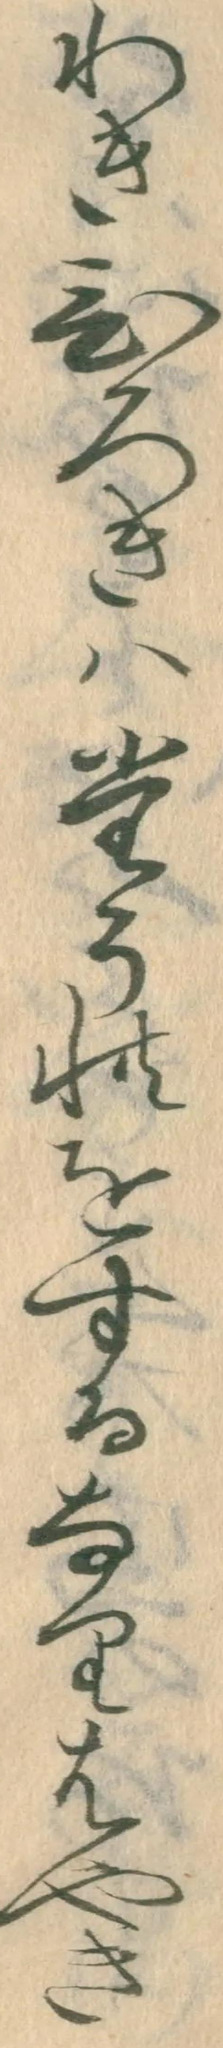わきひろきはたうれをするなりはやき
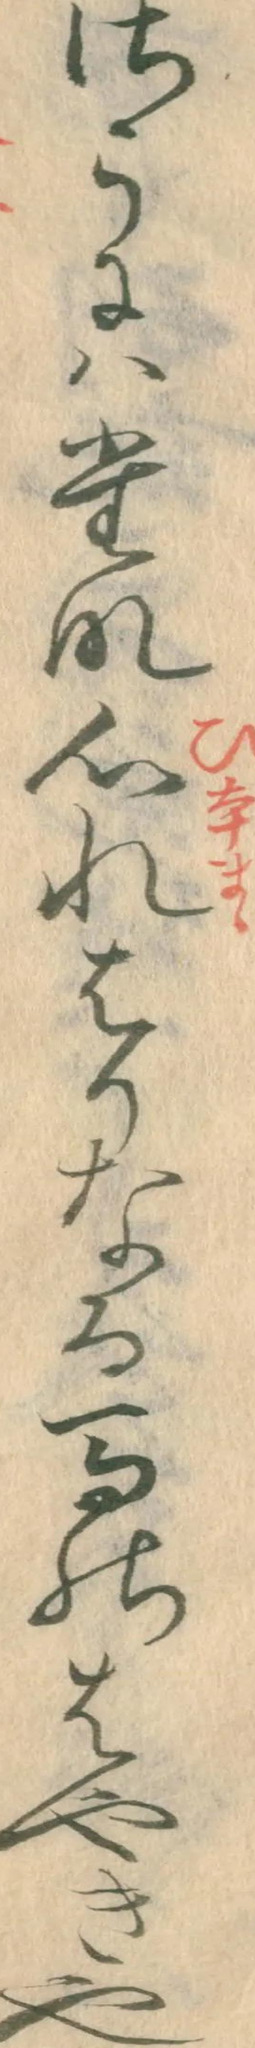さうにはたな心れはりなる馬のはやき也
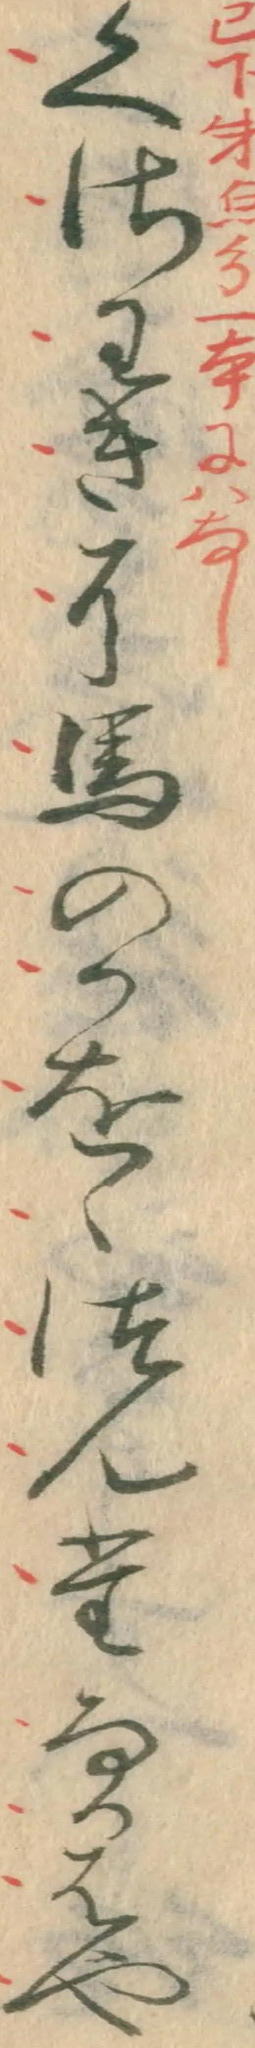「くさわきに馬のかをゝつんたるかはや

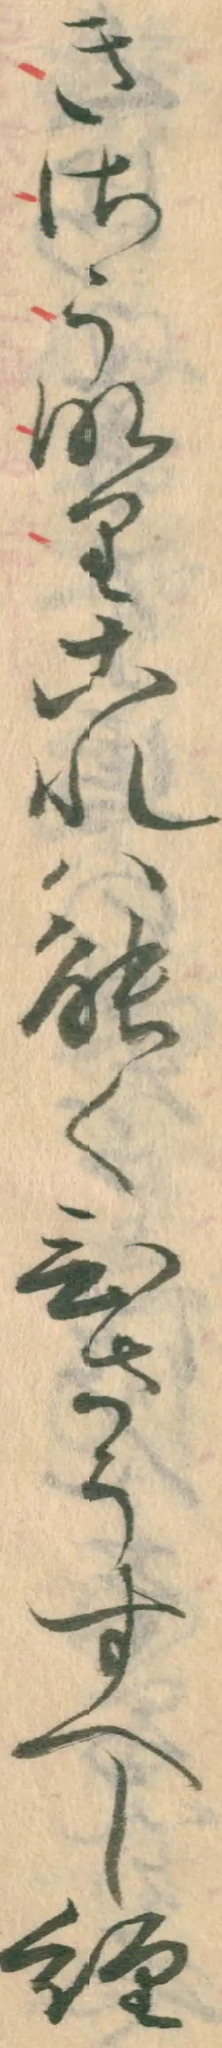きさうなり」これは能くひさうすへし経
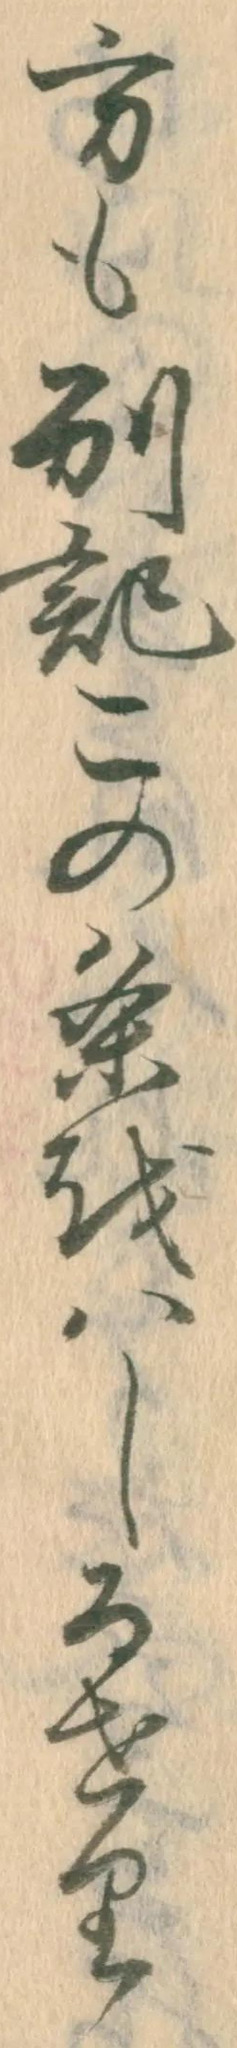方も別記この条をはしるせり
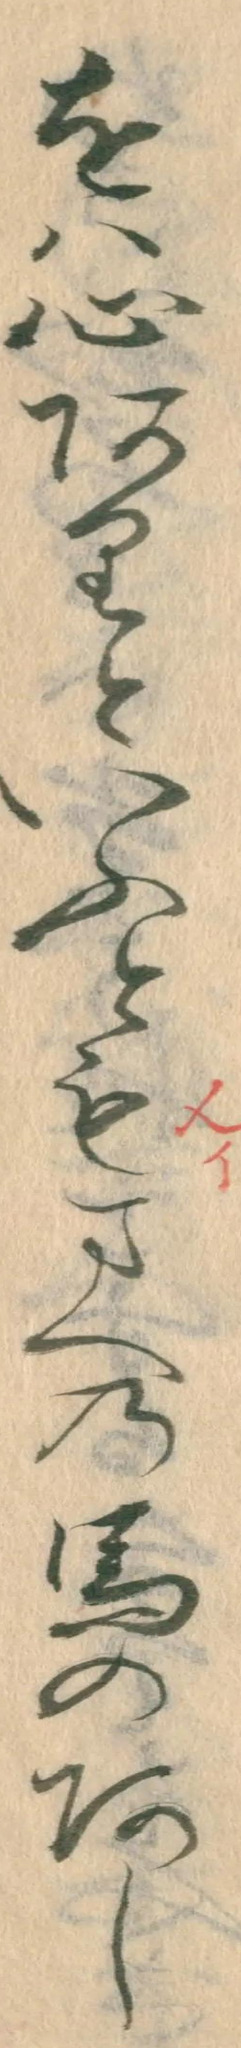一をは心ありといふともまへの馬のあし
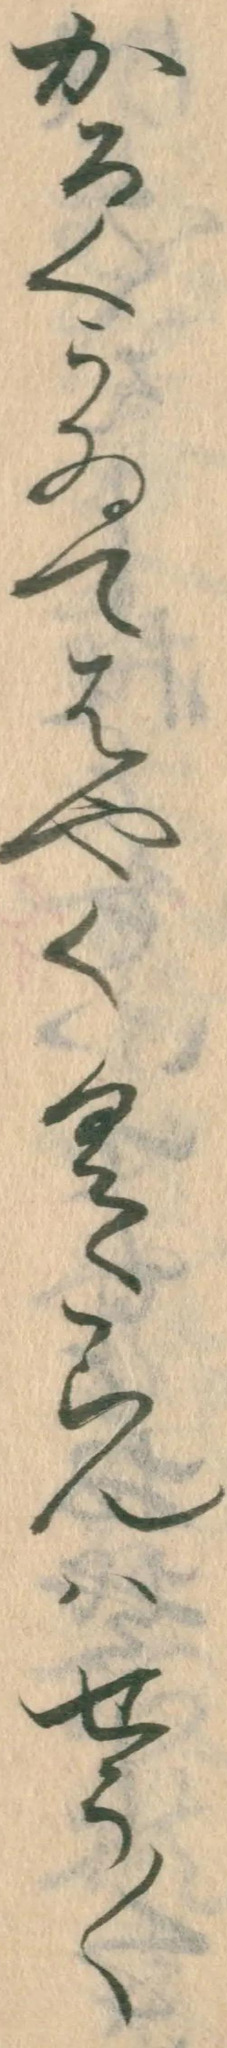かるくうゐてはやくくたらんはせう〳〵
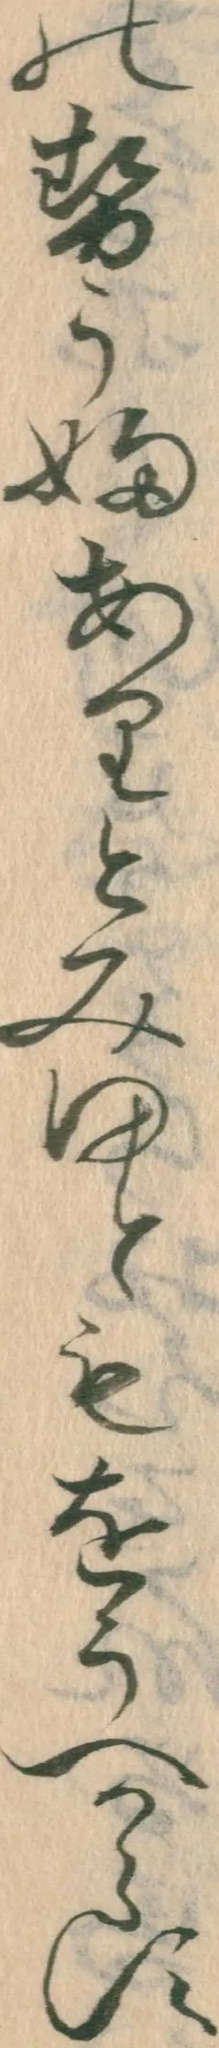のせうふありとみゆともをうへからす
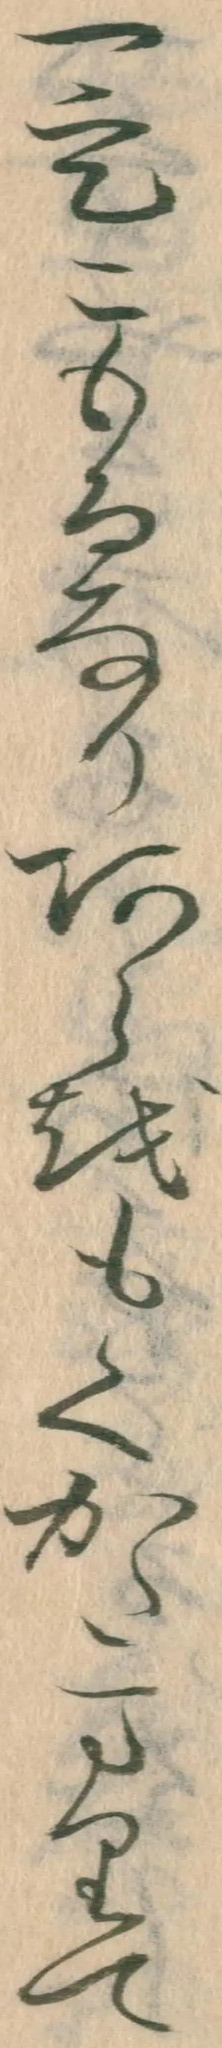一定こもるなりあらをもくかたまりて
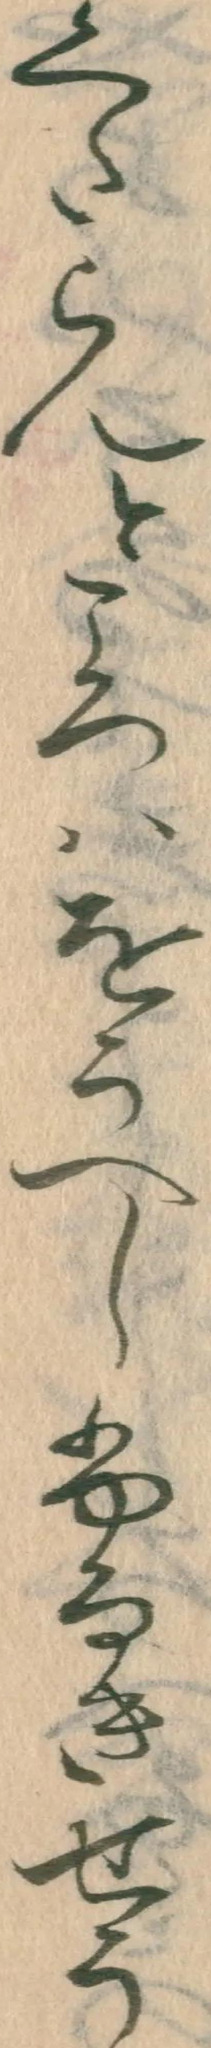くたらんところはをうへしふるきせう
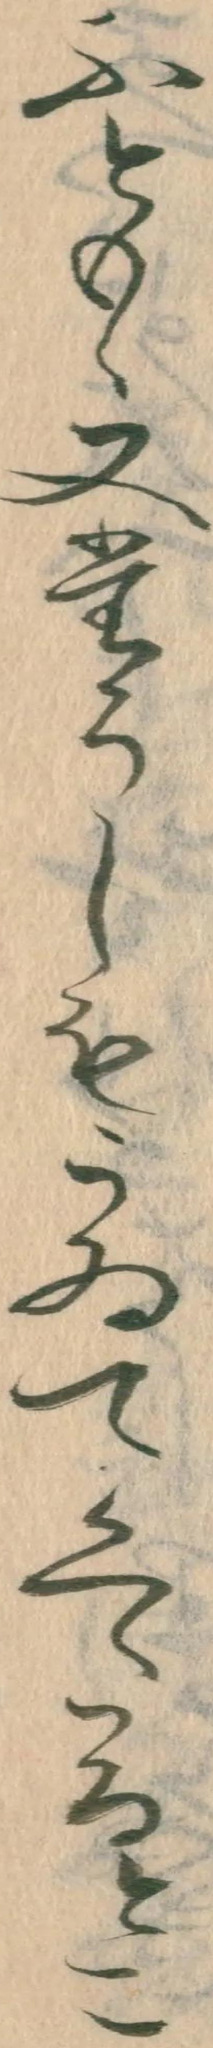ふともゝ又たうしもうゐてくたるとこ
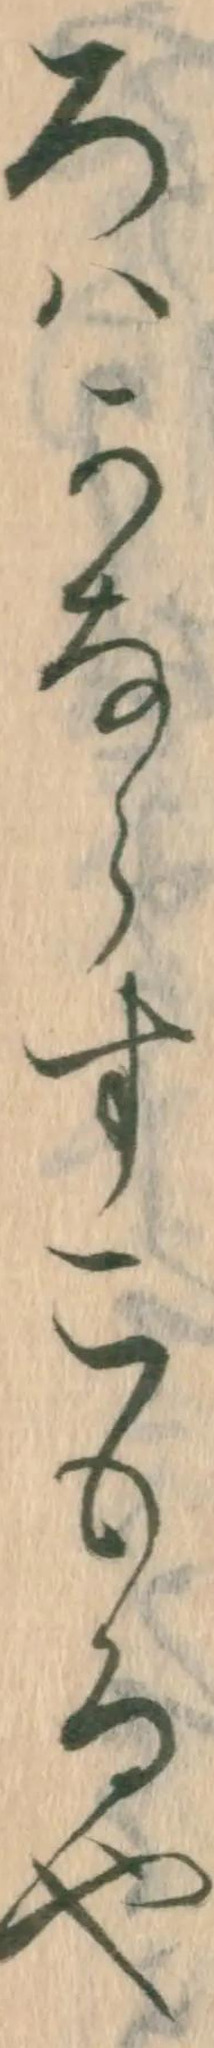ろはかならすこもる也
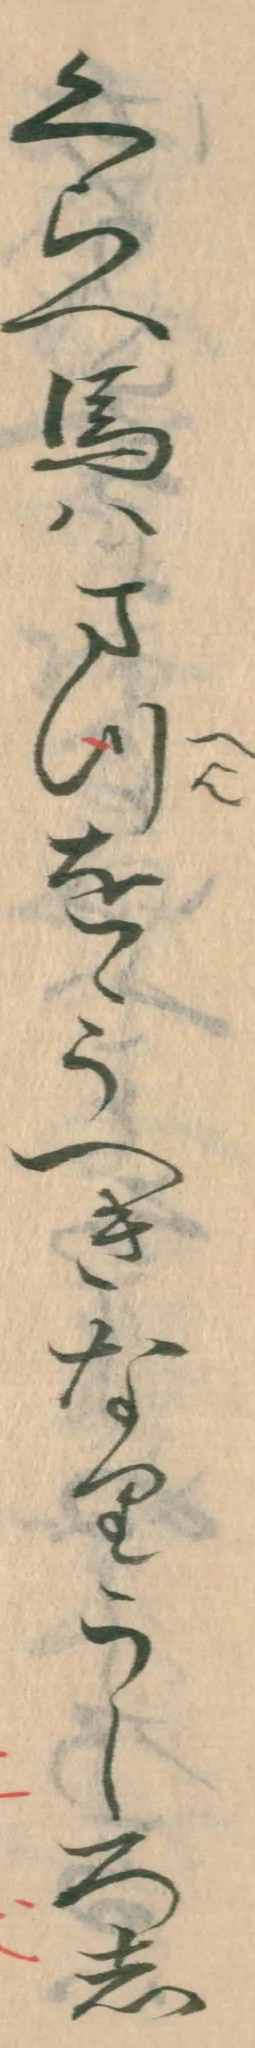一くらへ馬はまつをゝうへきなりうしろし
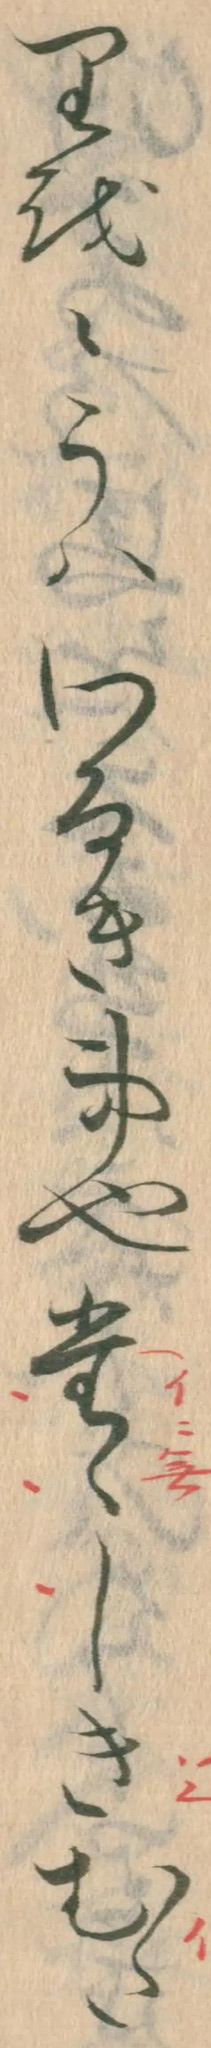りをゝうはわるき事也「たゝし」きむた
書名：賀茂社記録. 第13冊
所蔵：国立国会図書館 National Diet Library, JAPAN
